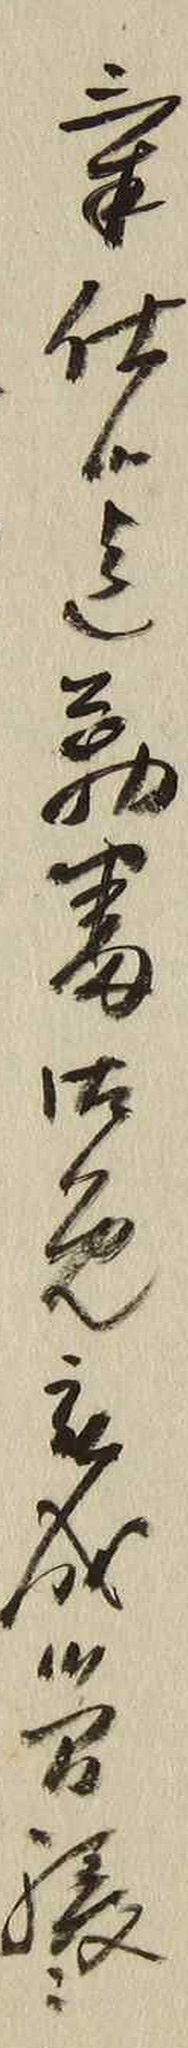気仕候迄勤番御免被成候間緩々
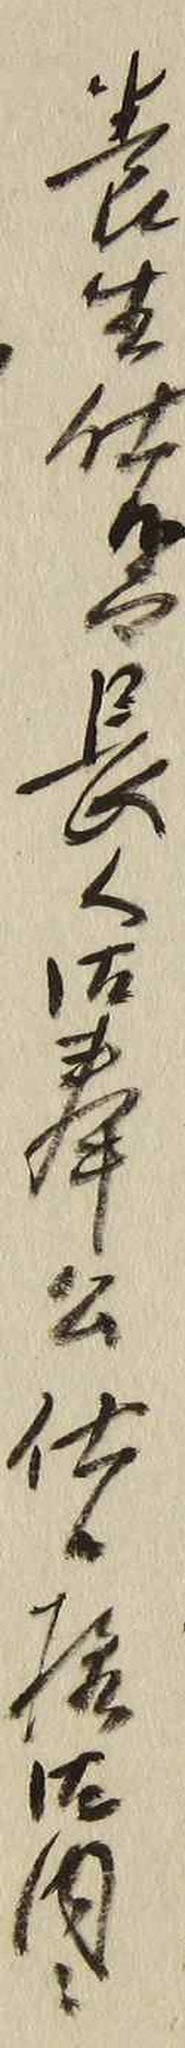養生仕候而長く御奉公仕候様御内々
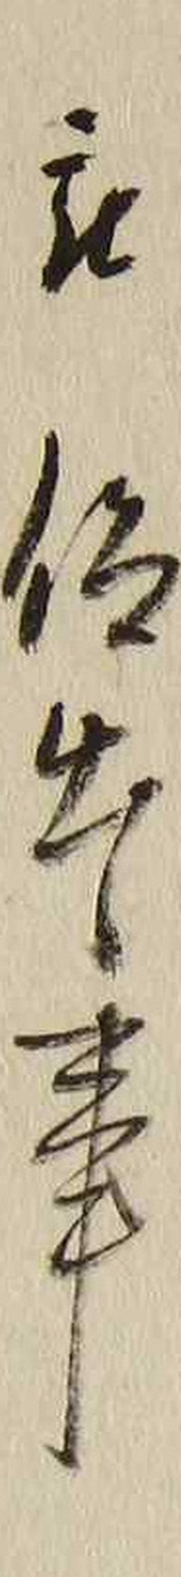被仰出候事
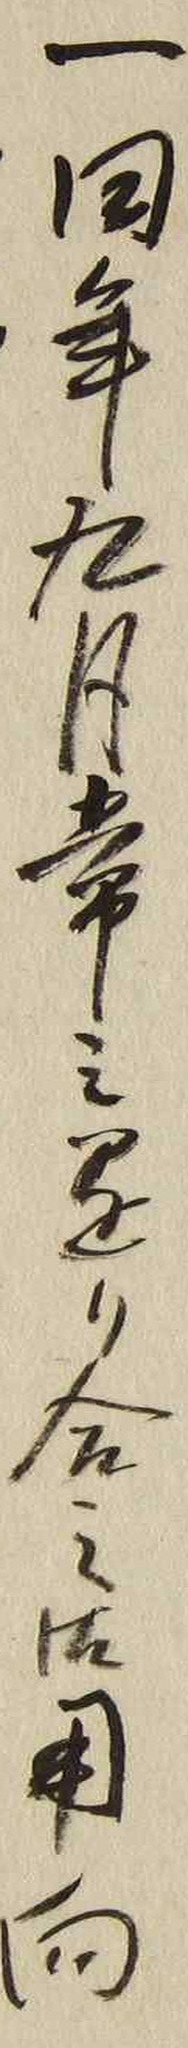一同年九月常之懸り合之御用向
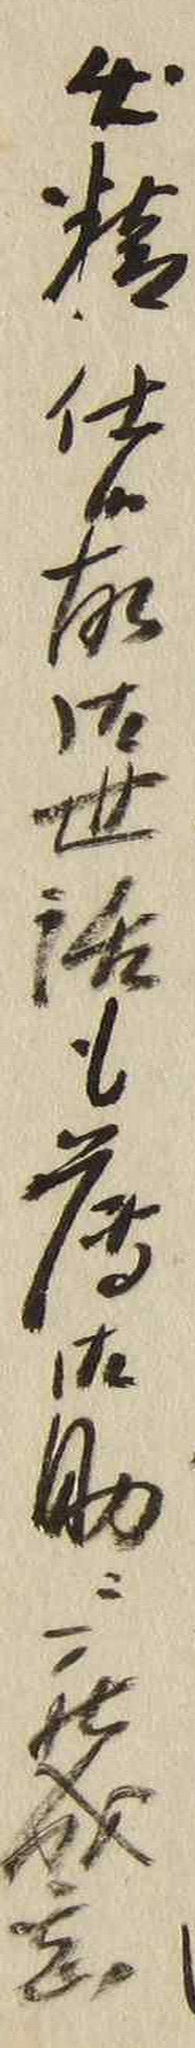出精仕候故御世話も薄御助に罷成甚

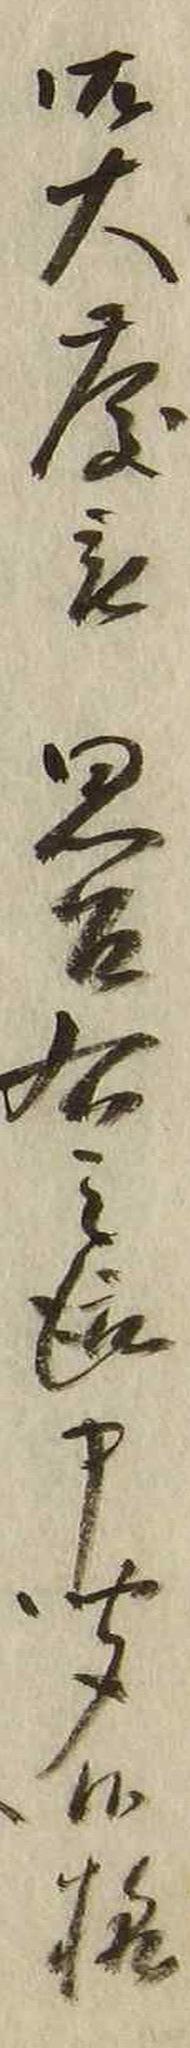御大慶被思召右之趣申聞候様
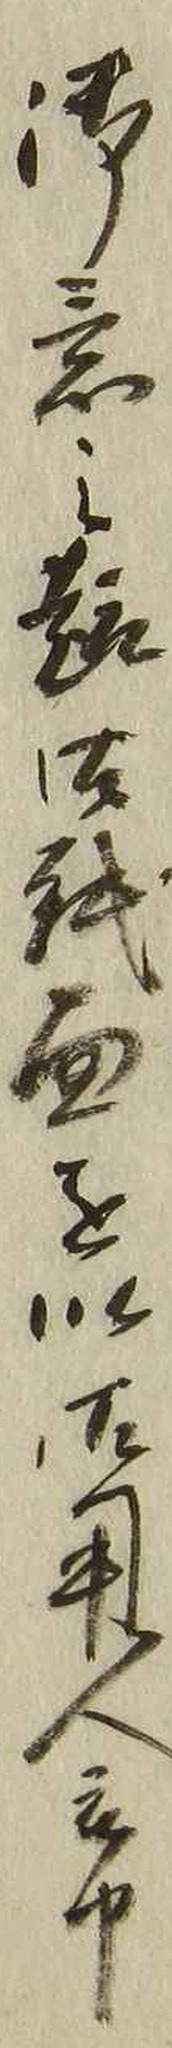御意之趣御紙面を以御用人被申
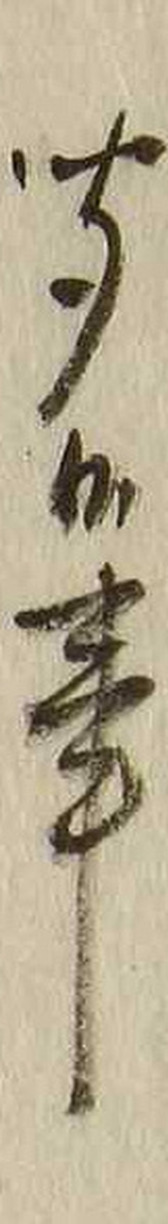聞候事
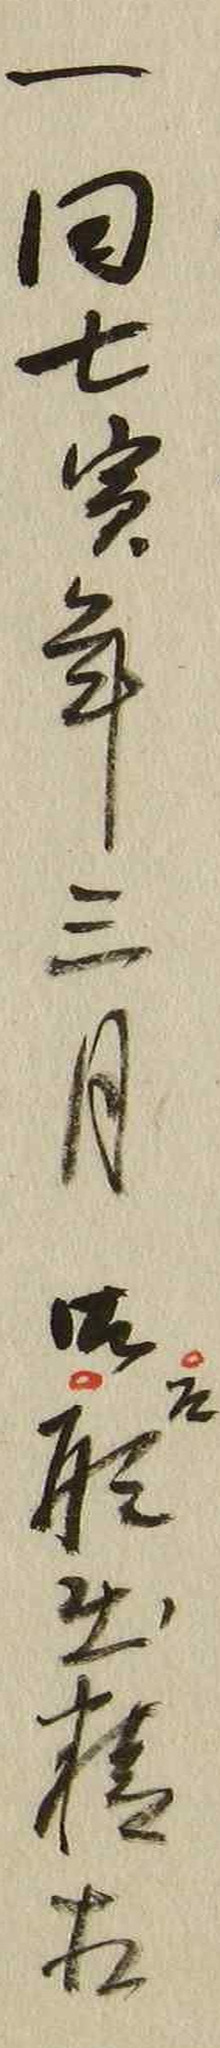一同七寅年三月御召形出精相
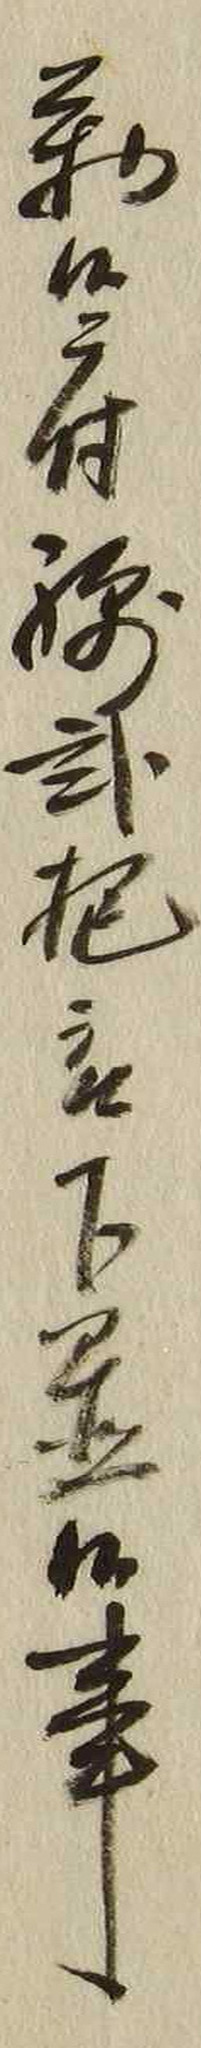勤候に付綿弐把被下置候事
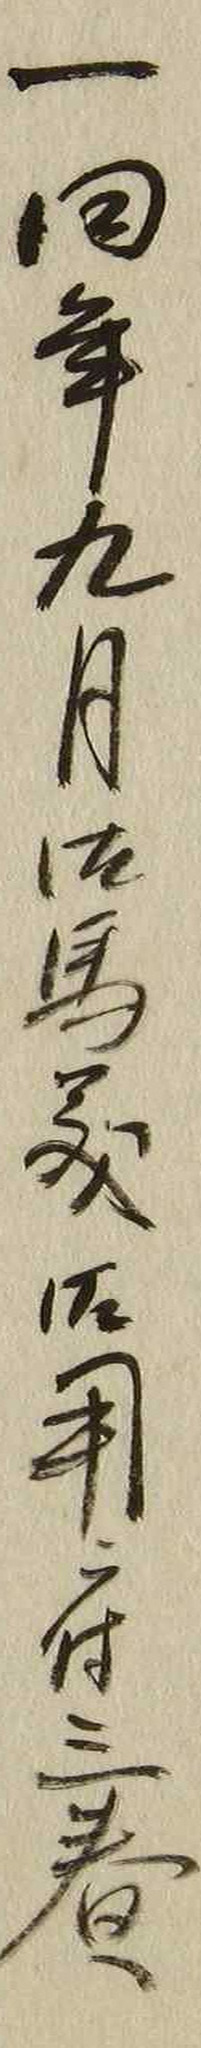一同年九月御馬義御用に付三春へ
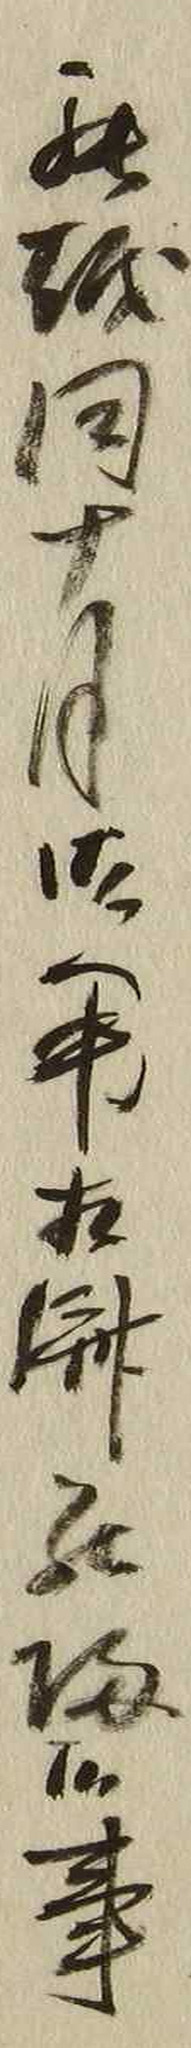罷越同十月御用相済罷帰候事
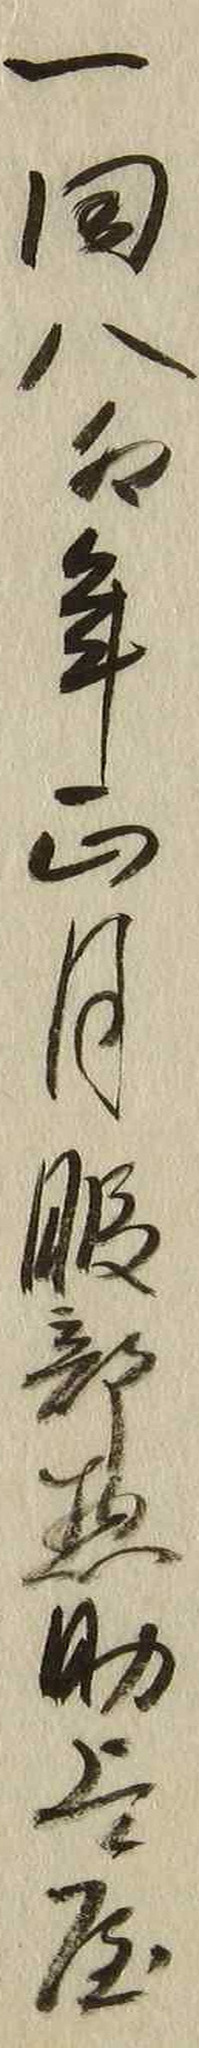一同八卯年正月服部惣助上ヶ屋
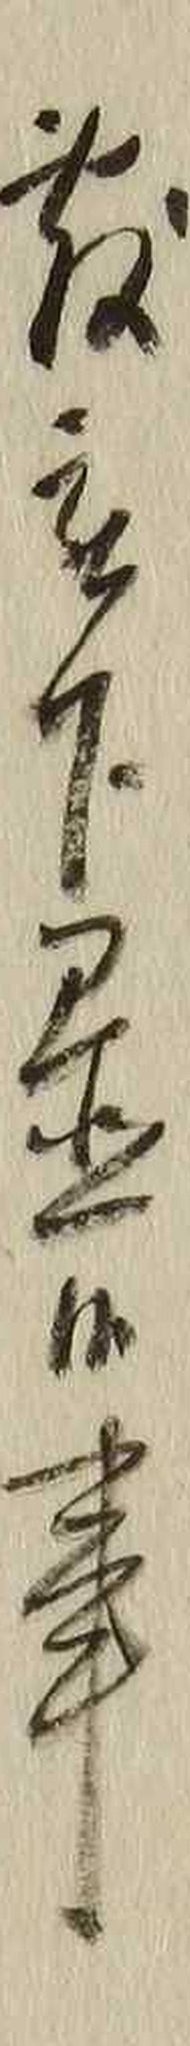敷被下置候事
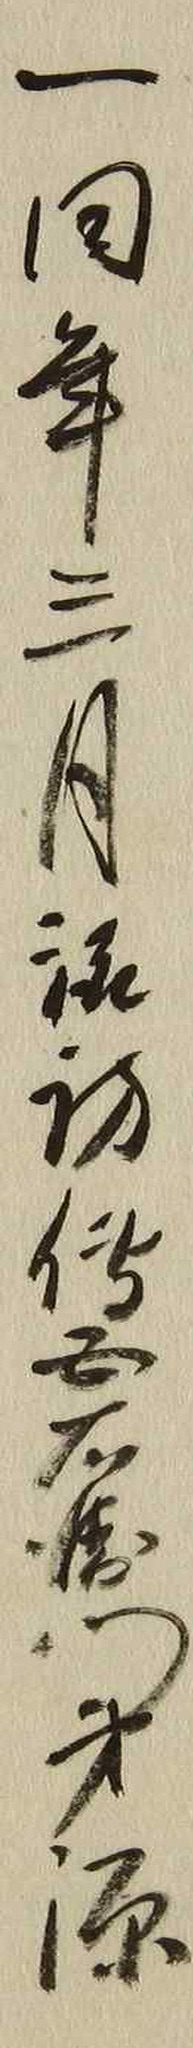一同年三月諏訪伝五右衛門弟源
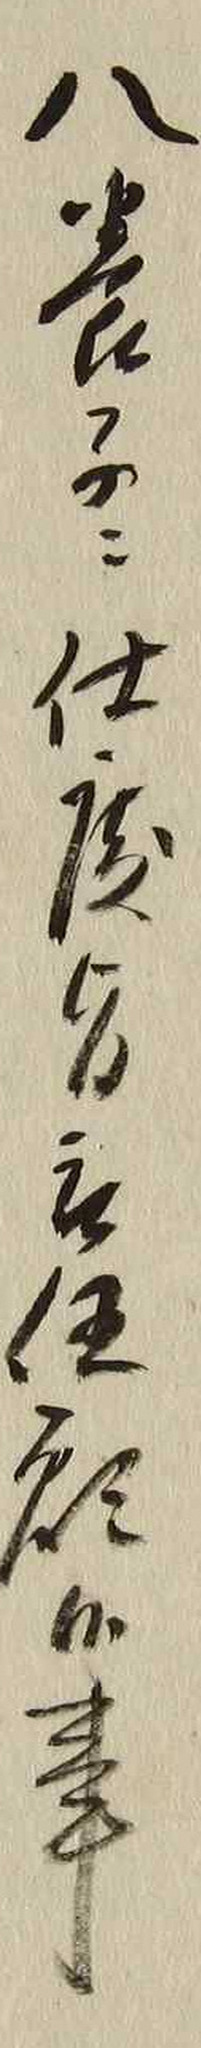八養子に仕度旨被任願候事
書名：諸士系譜　巻之360　す之部10
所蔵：会津若松市立会津図書館
